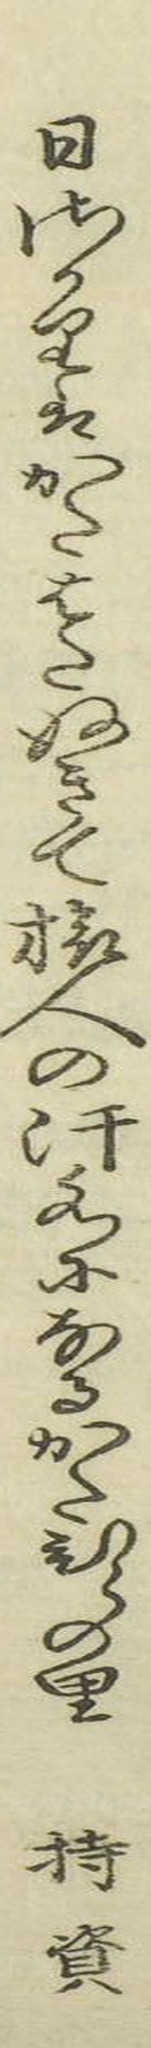日さかりはかたはたぬきて旅人の汗水になるかたひらの里持資
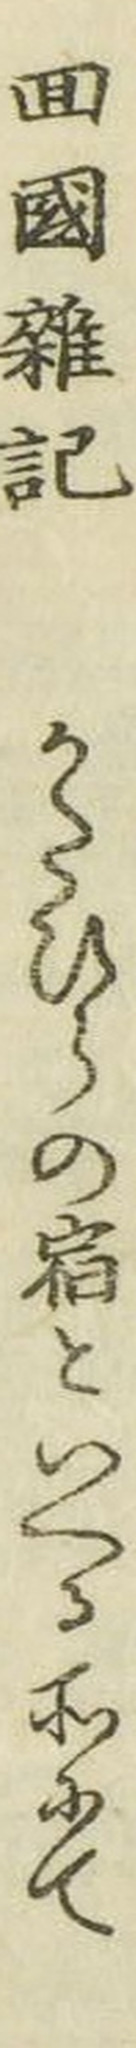回國雜記かたひらの宿といへる所にて
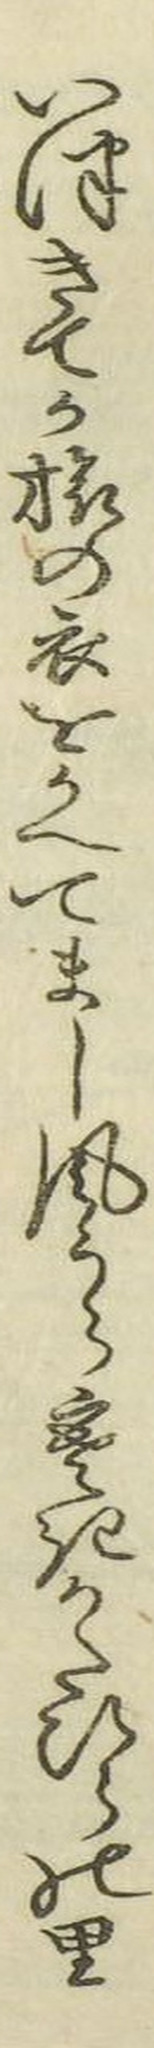いつきてか旅の衣をかへてまし風うら寒きかたひらの里道奥准后
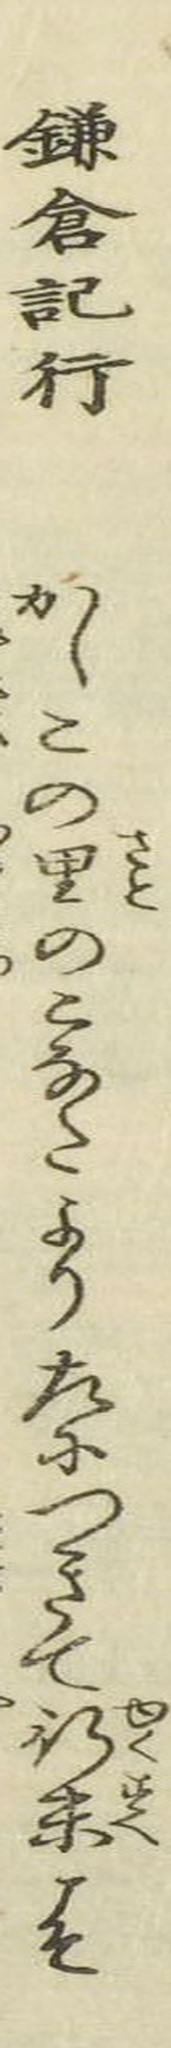鎌倉記行かしこの里のこなたより左につきて行末とそ
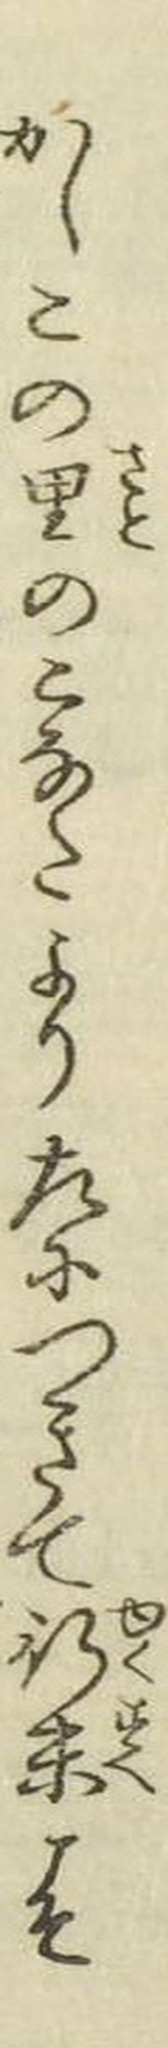鎌倉記行かしこの里のこなたより左につきて行末とそ
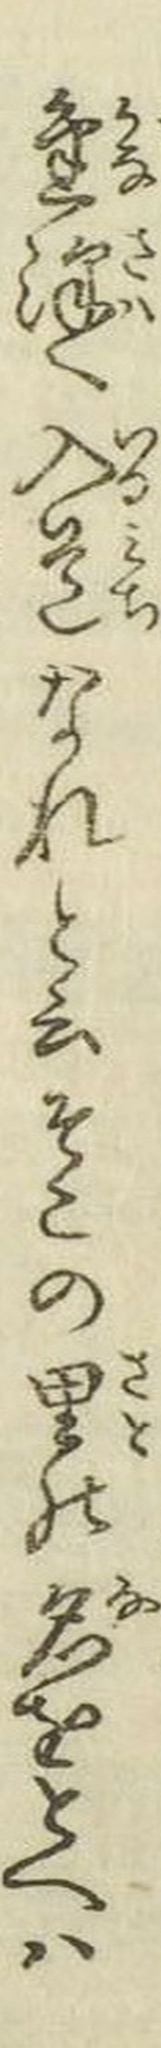金澤へ入道なれと云そこの里の名をとへは
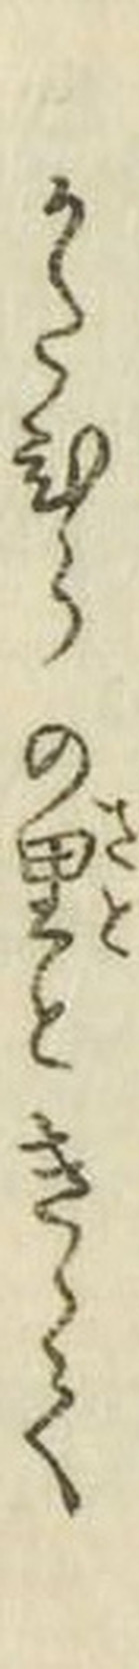かたひらの里ときゝて
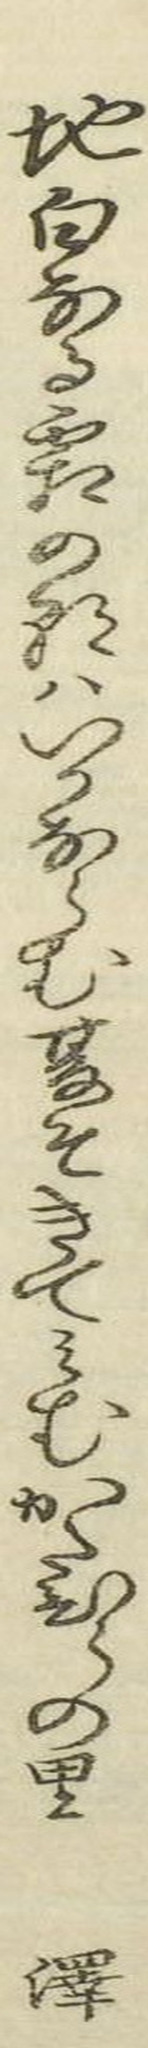地白なる霜の朝はいかならむ夏そきてみむかたひらの里澤庵
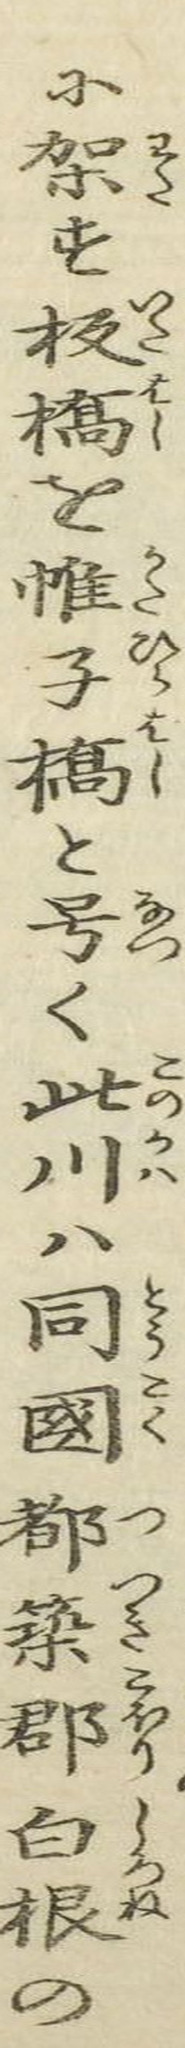に架す板橋を帷子橋と号く此川は同國都築郡白根の
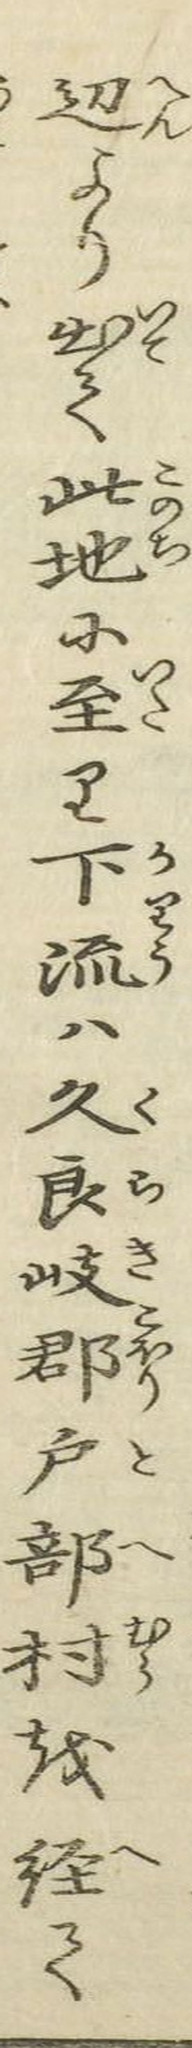辺より出て此地に至り下流は久良岐郡戸部村を経
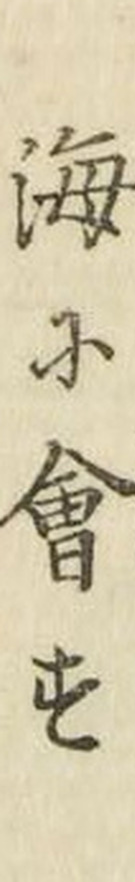海に會す
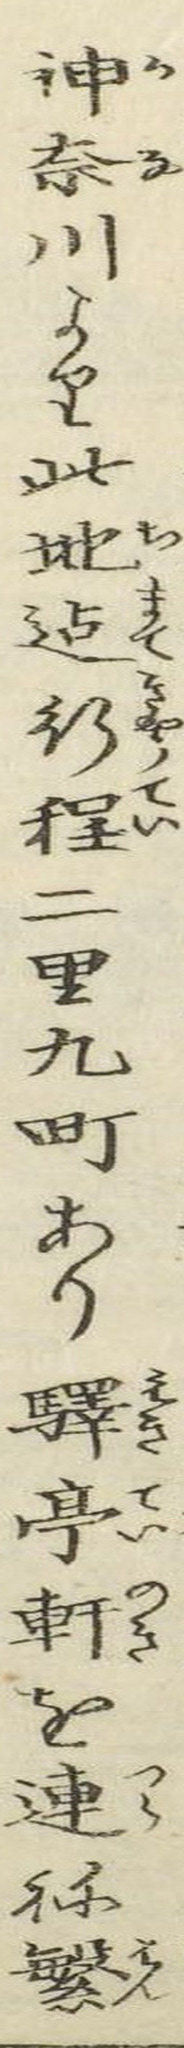神奈川より此地迄行程二里九町あり驛亭軒を連ね繁
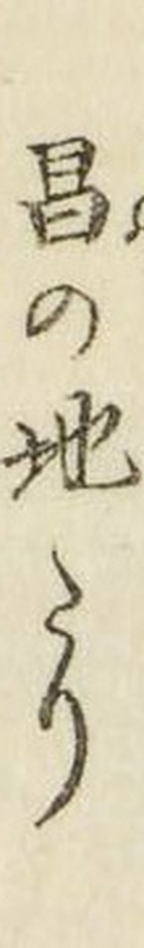昌の地なり
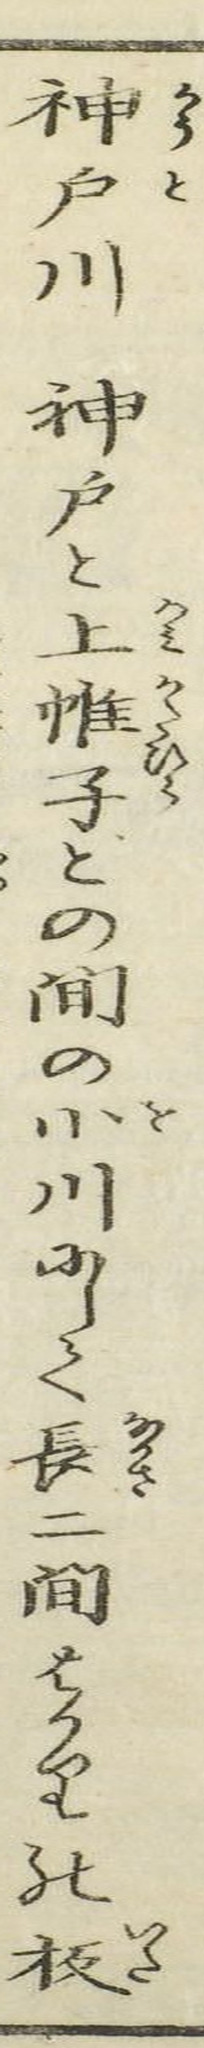神戸川神戸と上帷子との間の小川にして長二間はかりの板
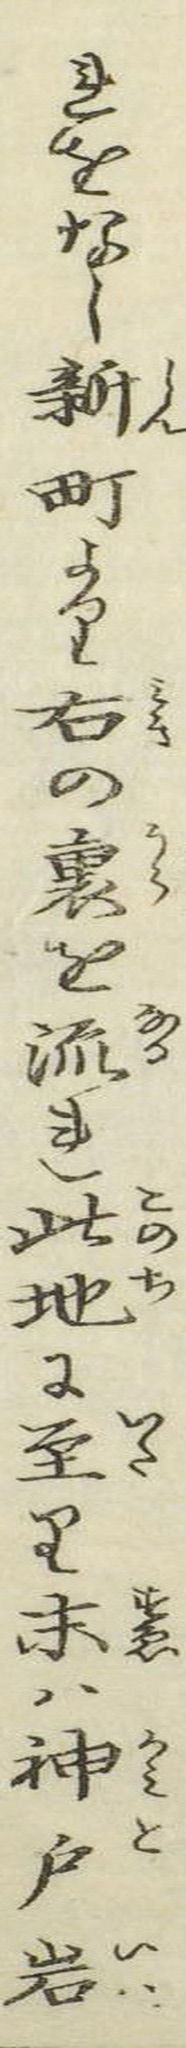れをなし新町より右の裏を流れ此地に至り末は神戸岩
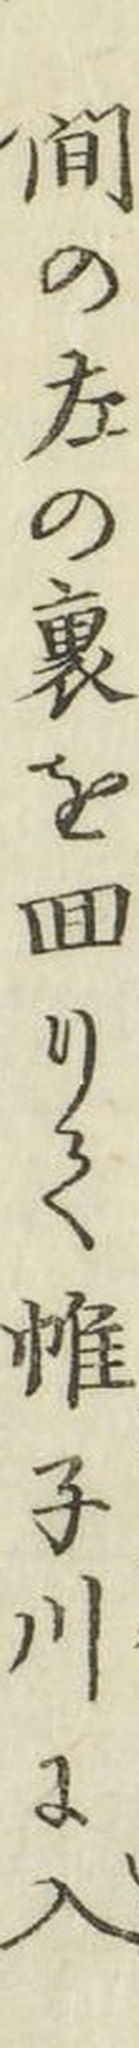間の左の裏を回りて帷子川に入
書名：江戸名所図会 20巻 巻之6
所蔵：東京学芸大学教育コンテンツアーカイブ
